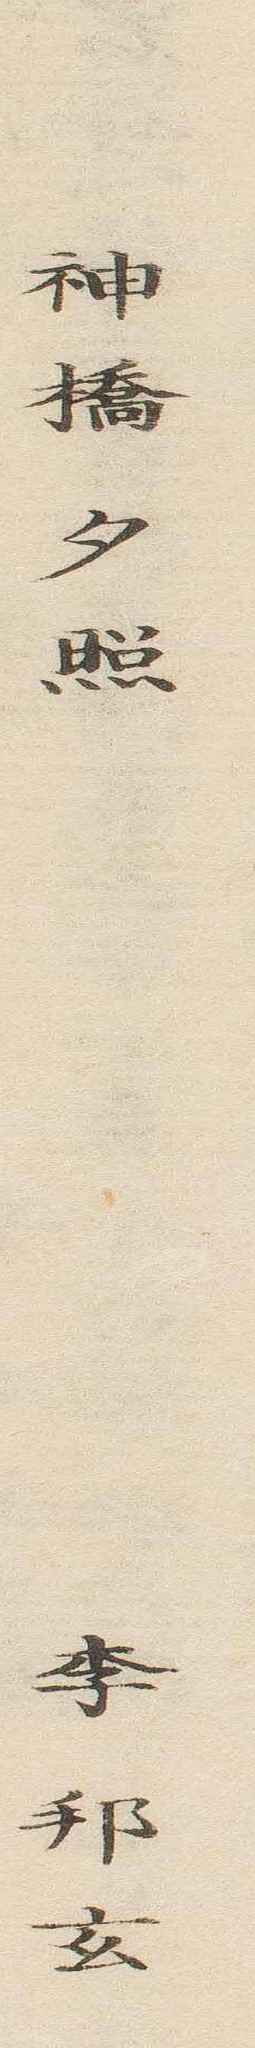神橋夕照李邦玄
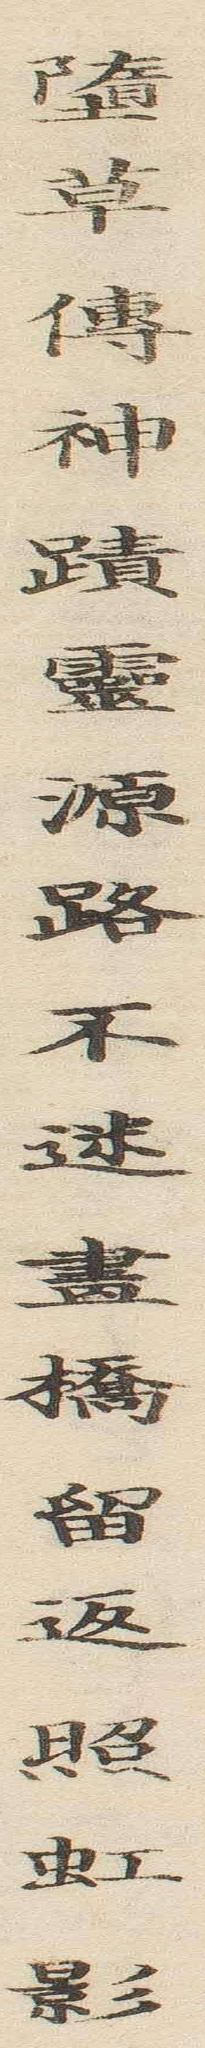墮草傳神蹟靈源路不迷畫橋留返照紅影
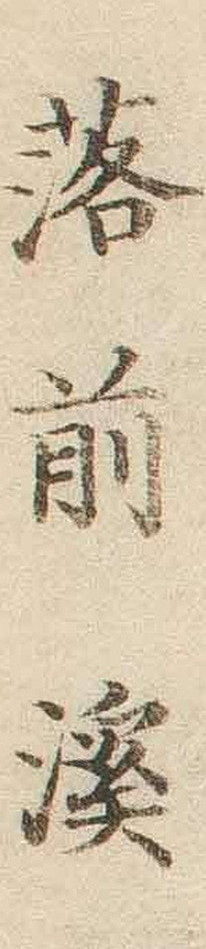落前溪
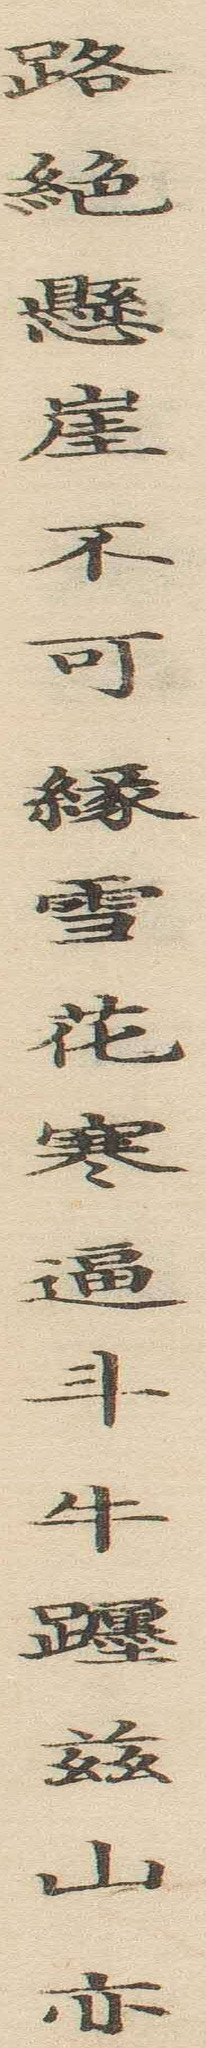路絶懸崖不可緣雪花寒逼斗牛躔兹山亦

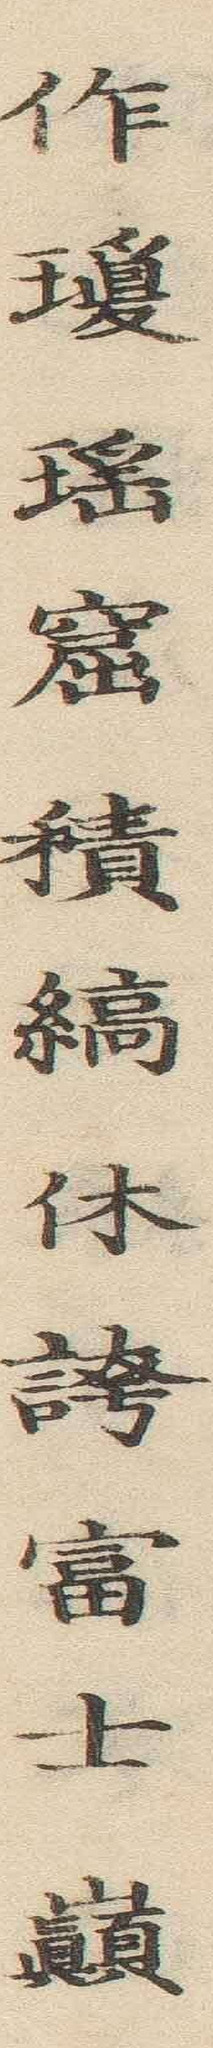作瓊瑶窟積縞休誇富士巓
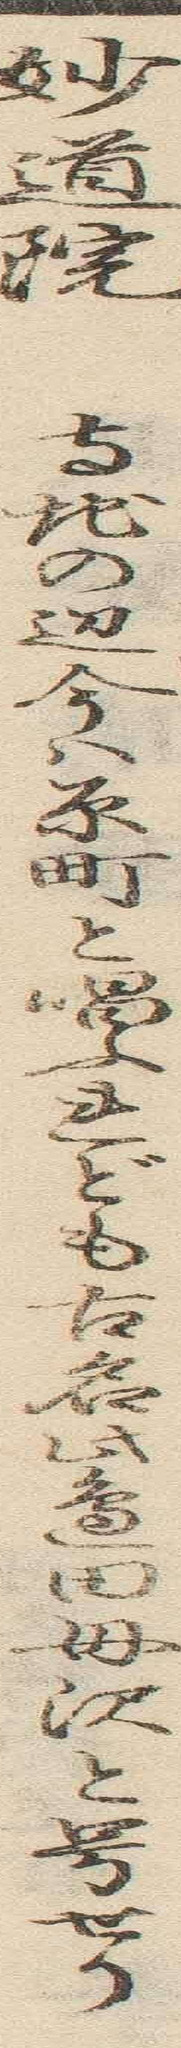妙道院寺地の辺今は原町と唱ふれども古名此邊田母沢と号せり
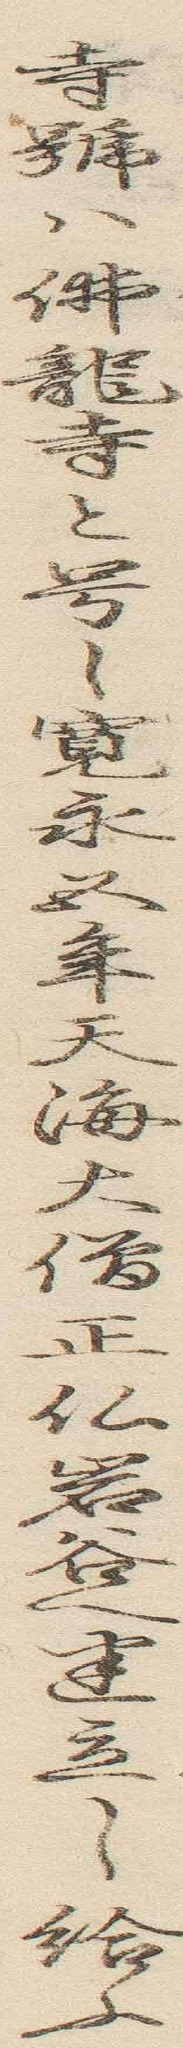時號は佛龍寺と号し寛永五年天海大僧正仏岩谷へ建立し給ふ
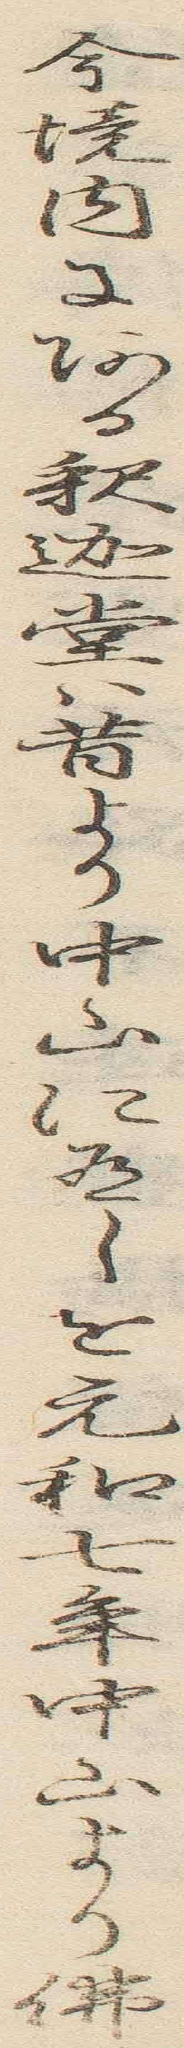今境内にある釈迦堂は昔より中山に有しを元和七年中山より佛
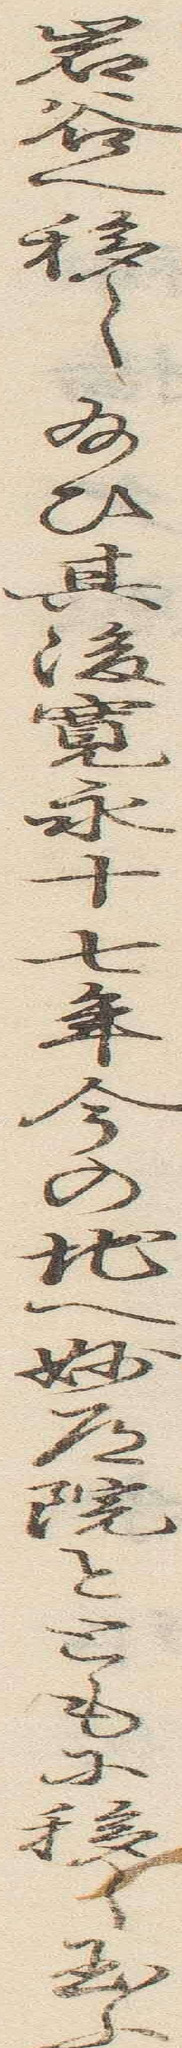岩谷へ移し給ひ其後寛永十七年今の地へ妙道院とともに移し玉ふ
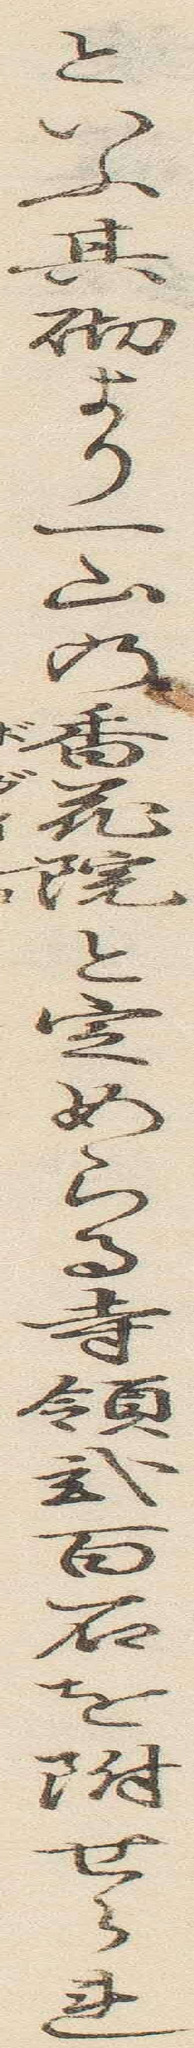といふ其砌より一山の香花院と定めらる寺領貮百石を附せられ
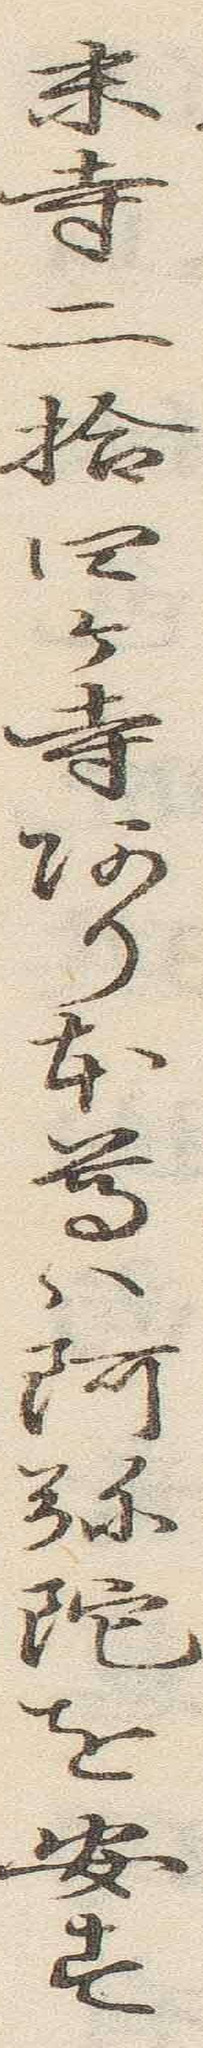末寺二拾四ヶ寺あり本尊は阿弥陀を安す
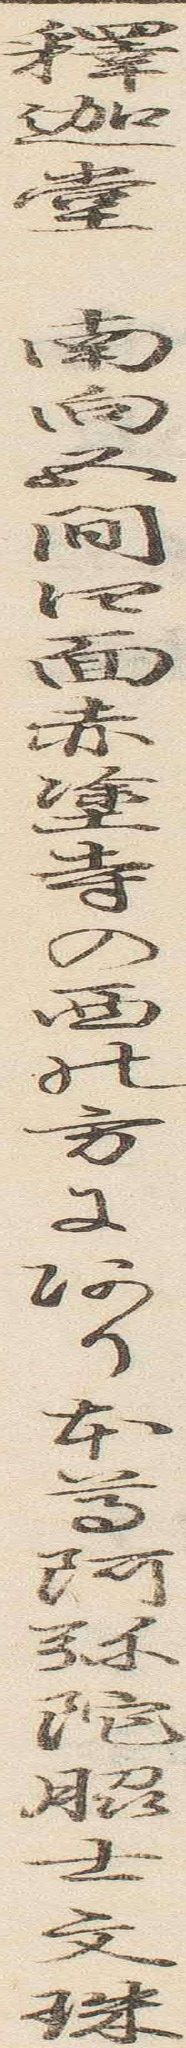釋迦堂南向五間四面赤塗寺の西の方にあり本尊阿弥陀脇士文珠
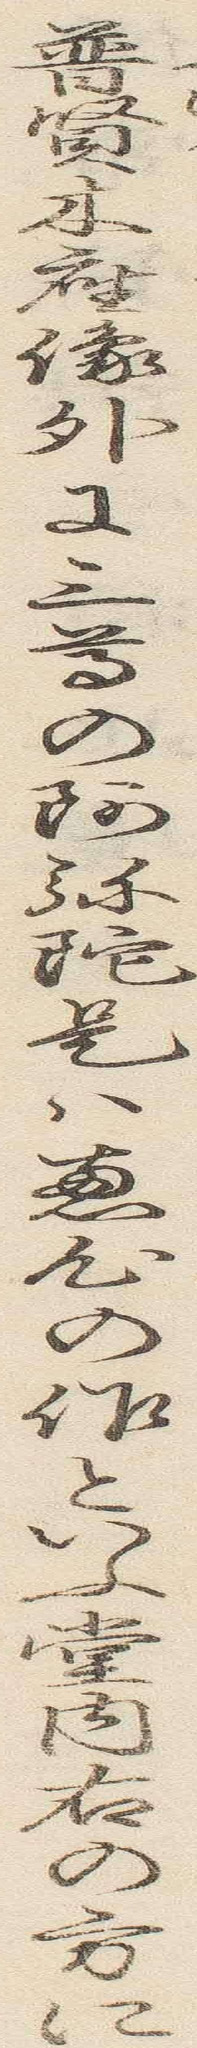普䝨木座像外に三尊の阿弥陀是は恵心の作といふ堂内右の方に
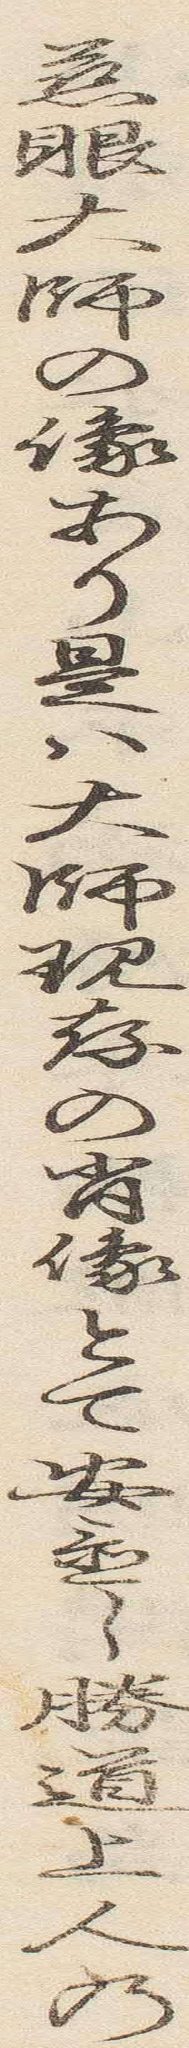慈眼大師の像あり是は大師現存の肖像とて安置し勝道上人の
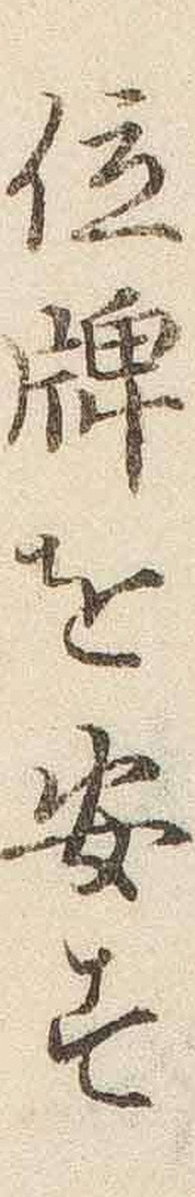位牌を安す
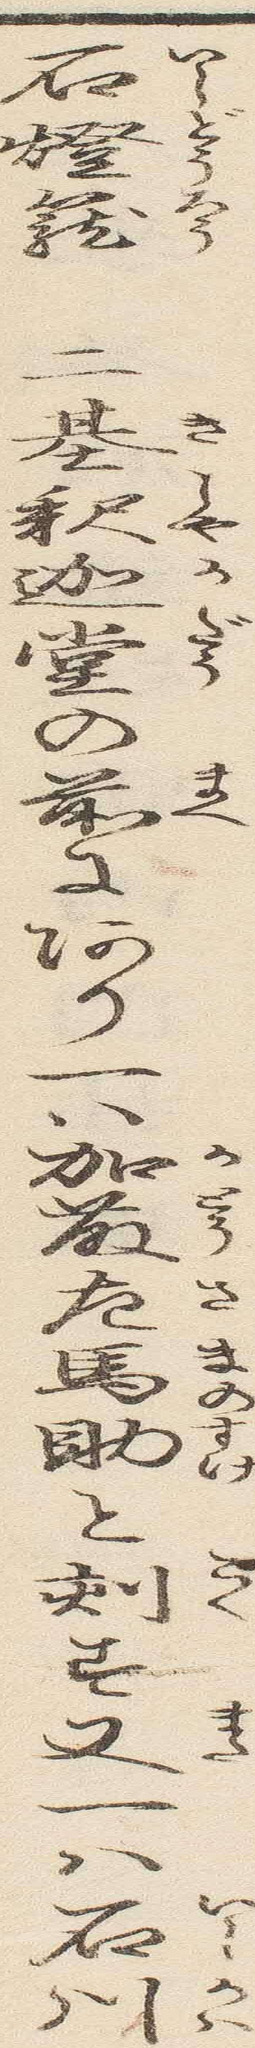石燈籠二基釈迦堂の前にあり一は加藤左馬助と𠜇す又一は石川
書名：日光山志
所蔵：東京学芸大学附属図書館 国文学研究資料館
